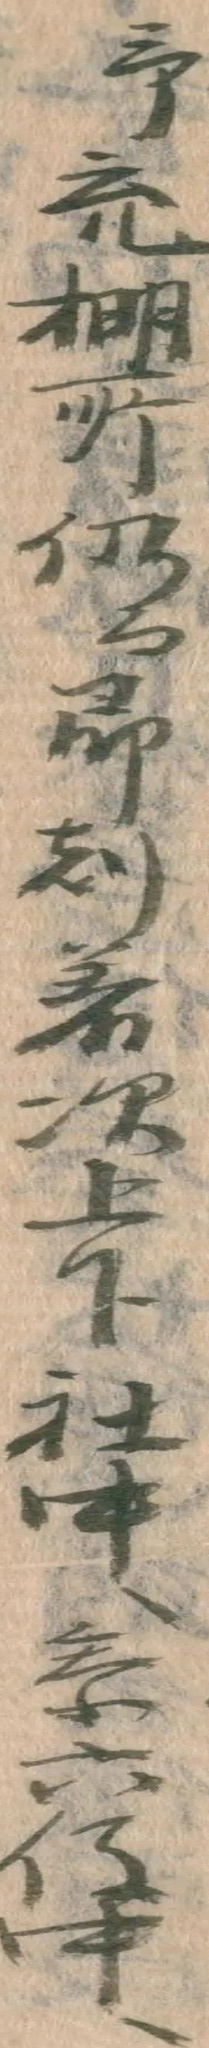予充棚所、仍而即刻着次上下、社中へ参、六役中へ
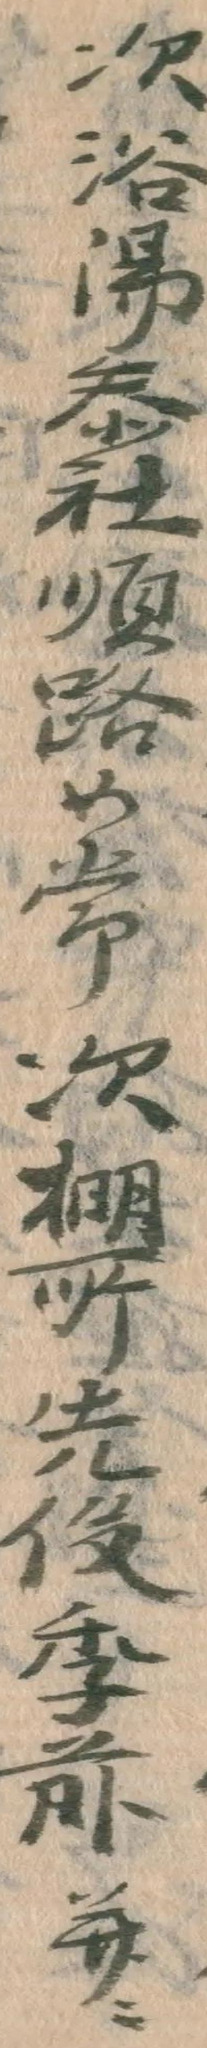次浴湯、参社、順路如常、次棚所先役季前并ニ
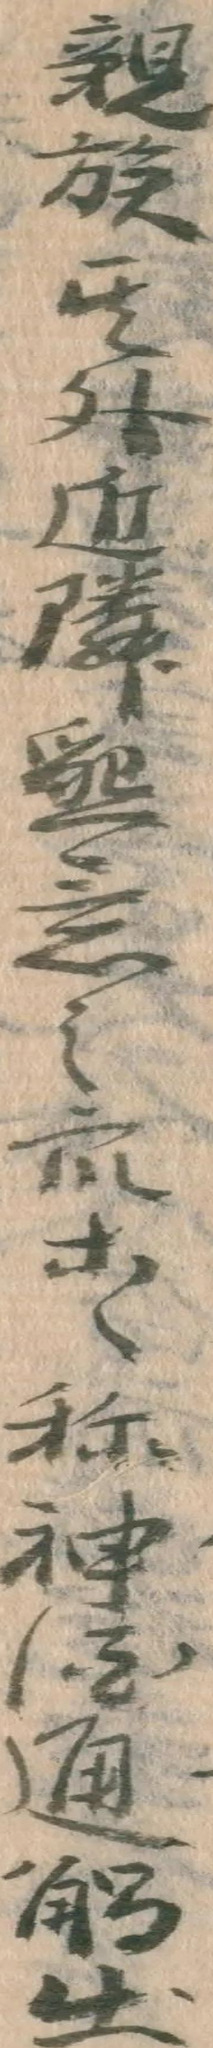親族其外近隣懇意之衆等へ称神供通触出
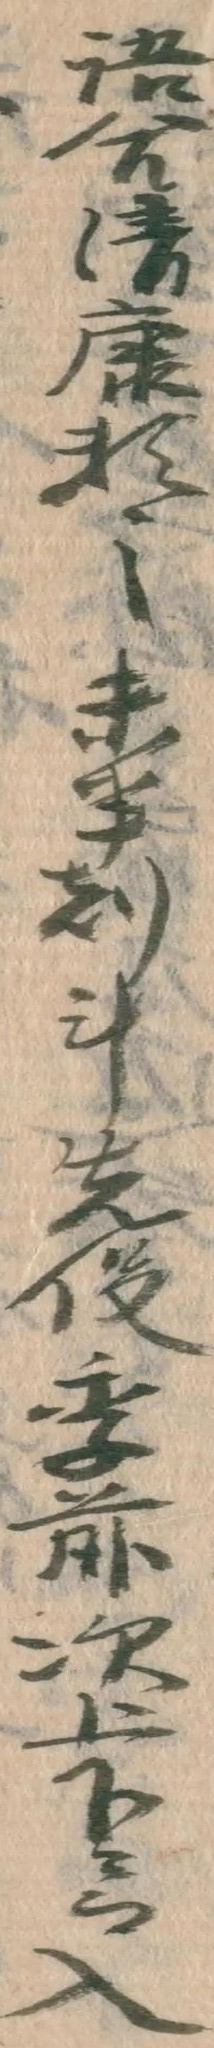語合清康頼之、未半刻計先役季前次上下ニ而入
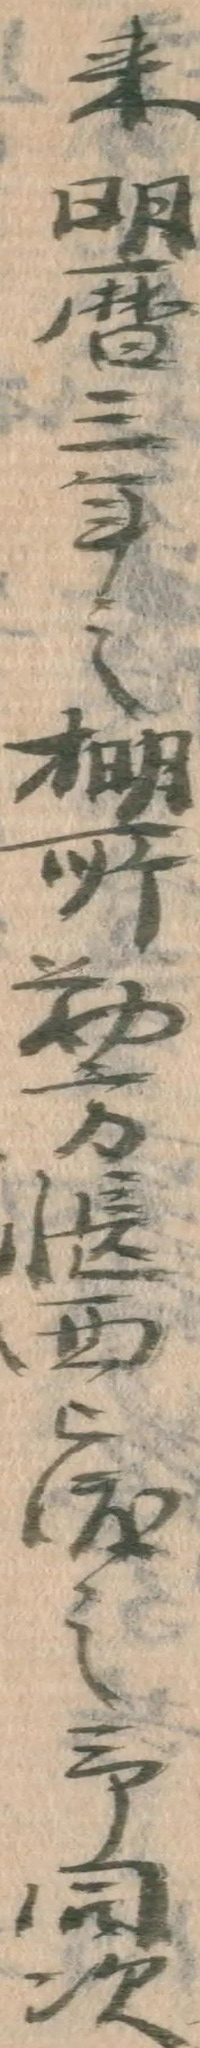来、明暦三年之棚所勤方帳面被渡也、予同次
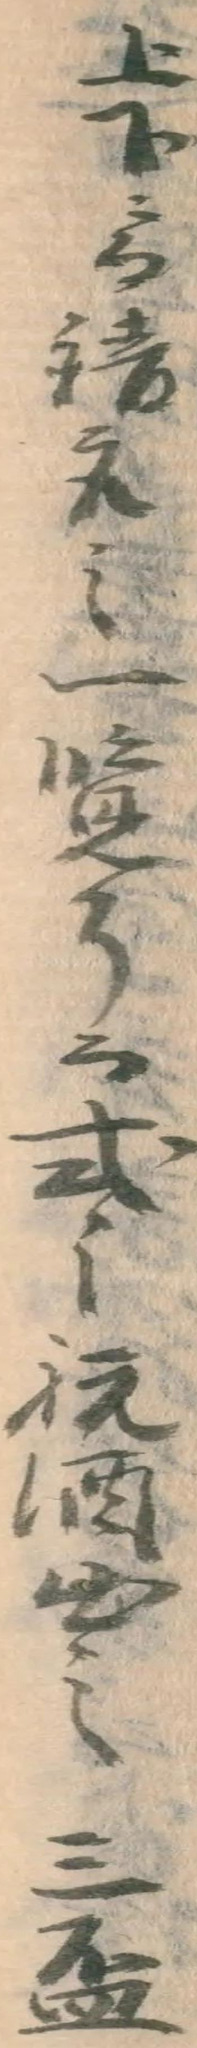上下ニ而請取之一覧、了而式之祝酒出之、三盃
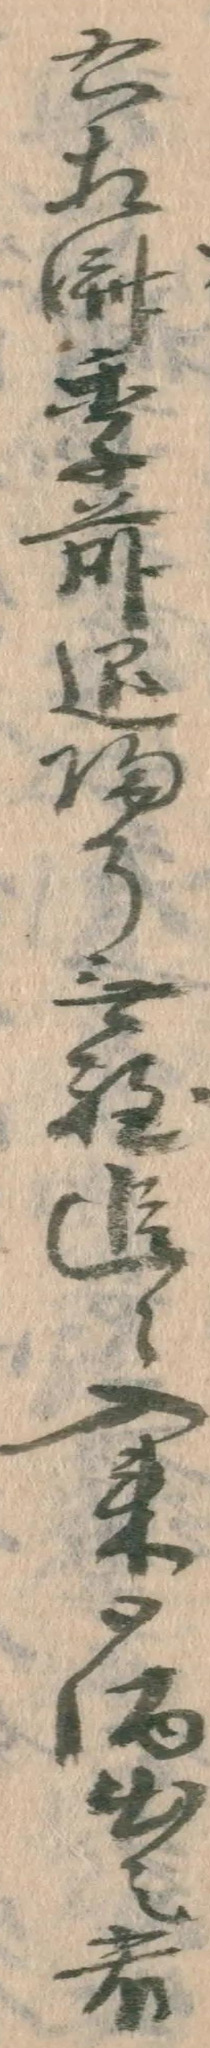右相済、季前退帰了、無程追々入来御酒出之、肴
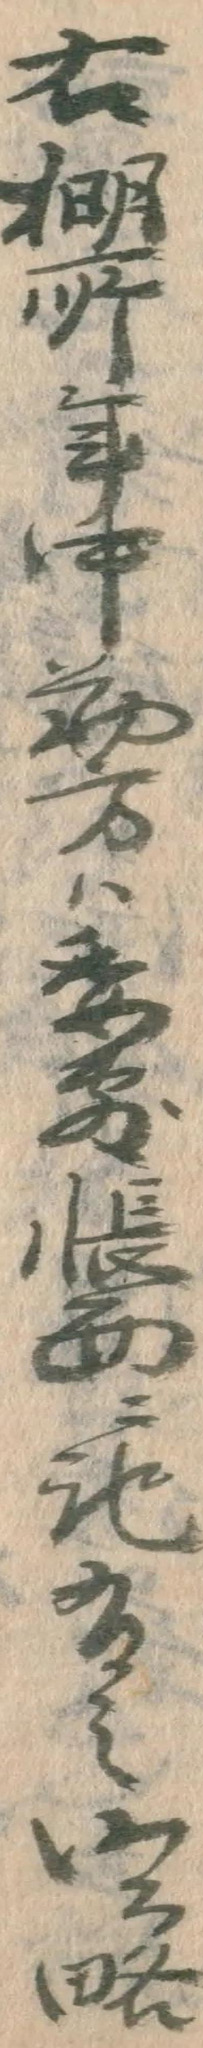右棚所年中勤方ハ委敷帳面ニ記有之、仍而略
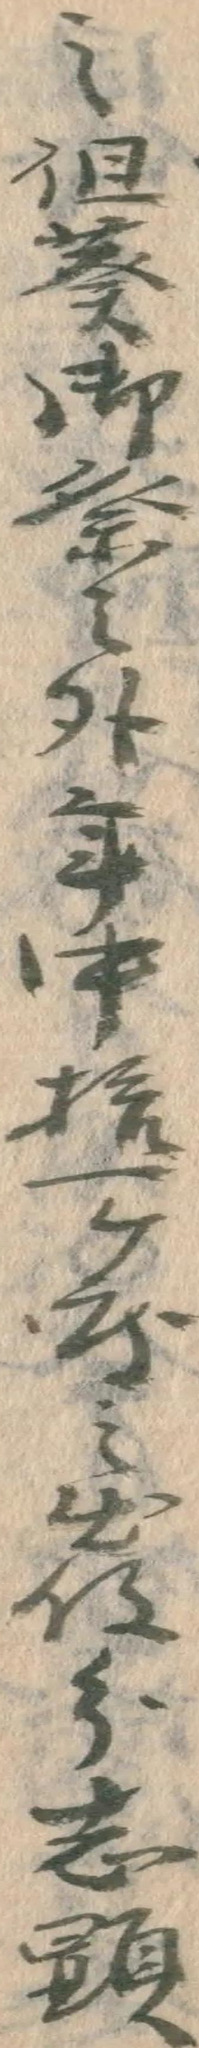之、但葵御祭之外年中拾一ヶ度之出役分、志顕
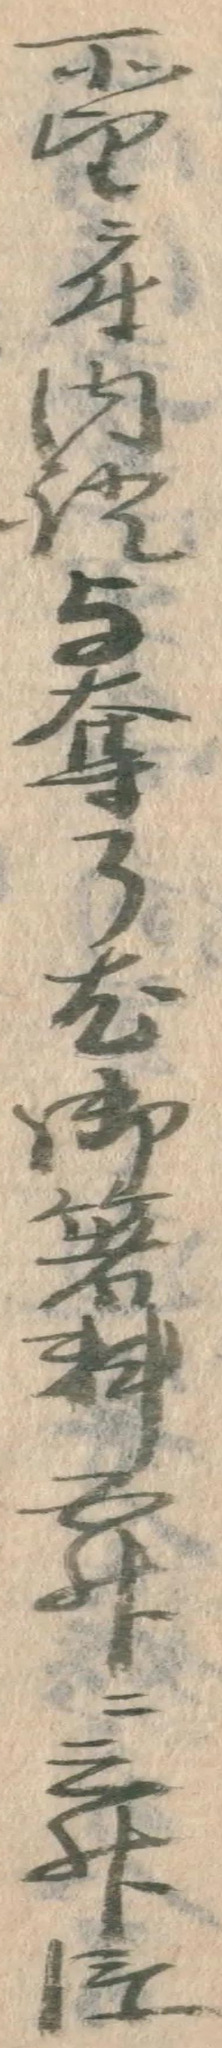所望ニ付、内証与奪了、尤御箸料五升ニ三升添
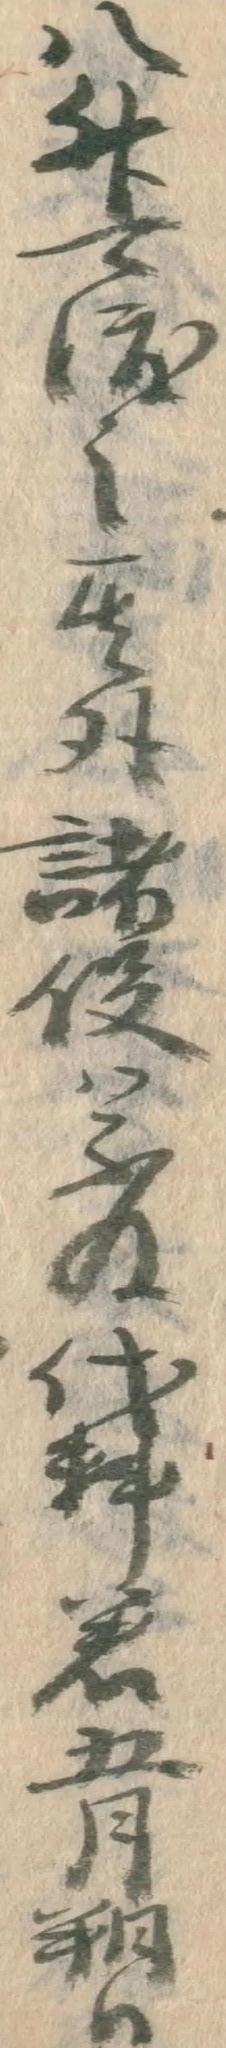八升可渡之、其外諸役ハ不及代料、若五月朔日
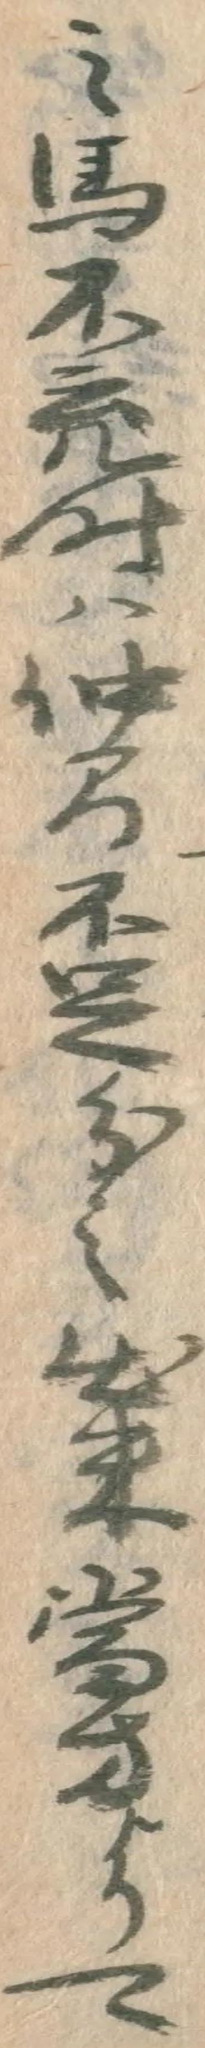之馬不充時ハ仲間不足分之出来方より可

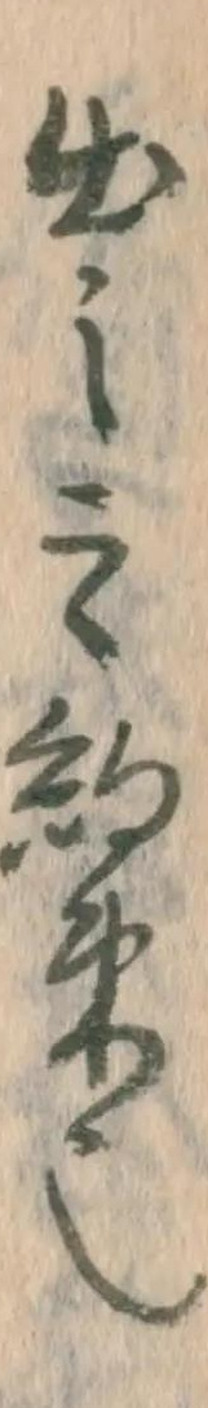出之之約束也、
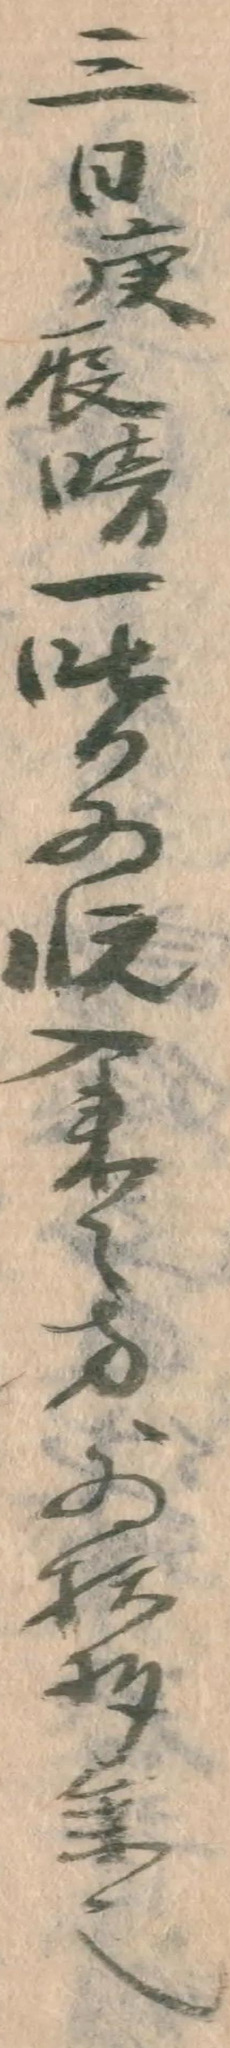三日庚辰晴、一昨日為祝入来之方へ為挨拶参之、
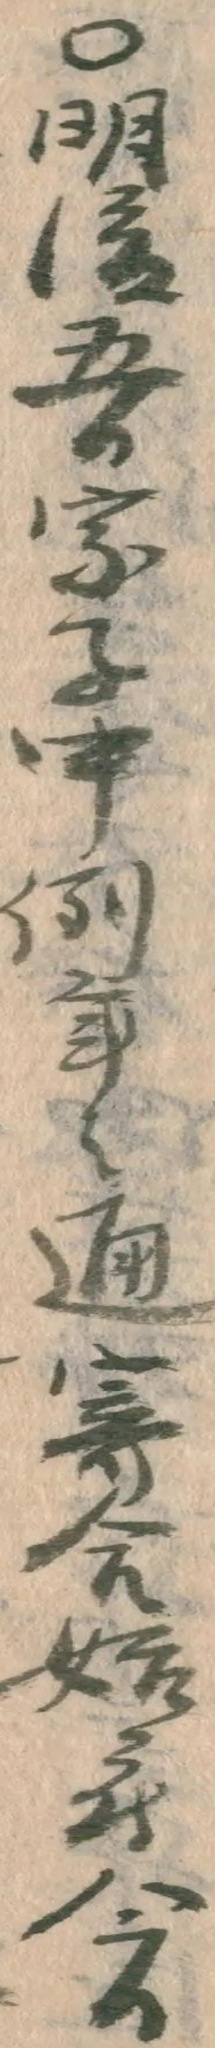○明後五日家子中例年之通寄合始ニ付、今日
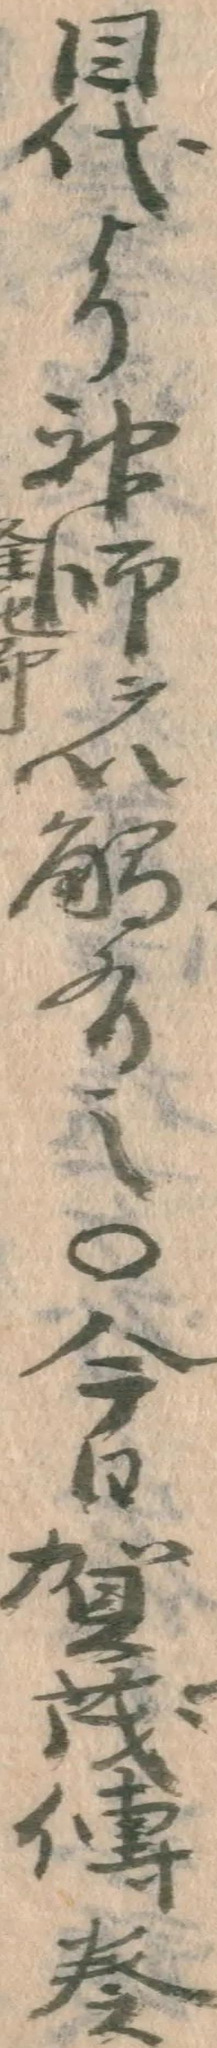目代より神師を以触有之、○今日賀茂傳奏
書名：賀茂社記録. 第63冊
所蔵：国立国会図書館 National Diet Library, JAPAN
